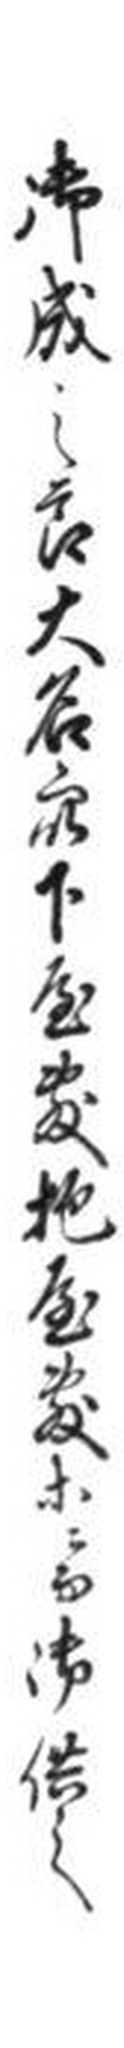御成之節大名衆下屋敷抱屋敷等ニ而御供之
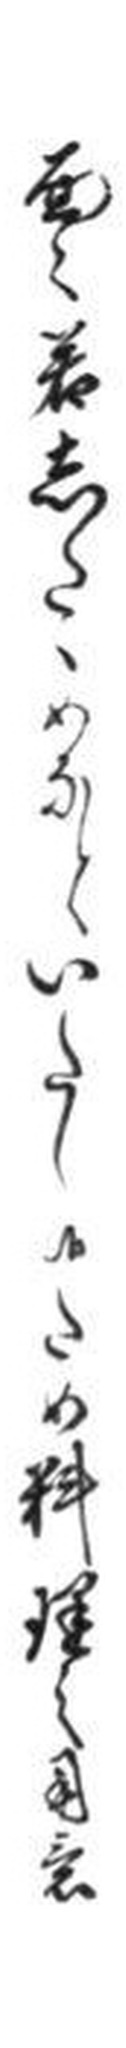面々若したゝめなといたし候ため料理之用意
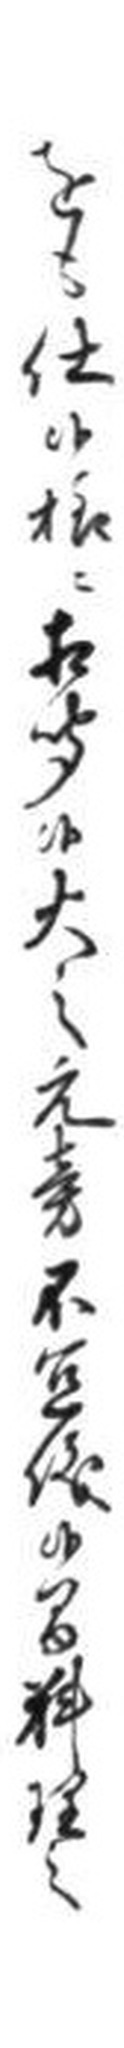をも仕候様ニ相聞候火之元旁不宜儀候間料理之
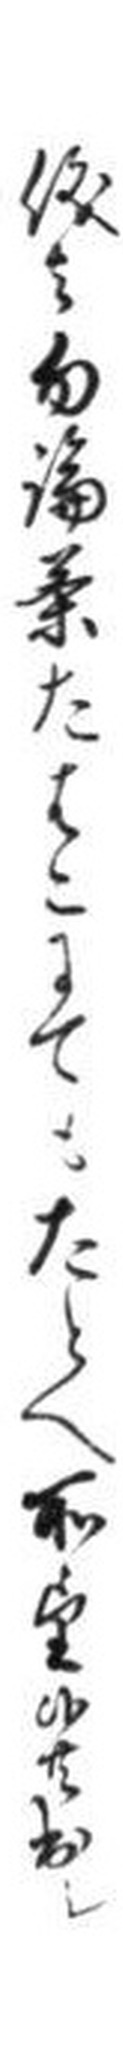儀者勿論茶たはこにてもたとへ所望候共出シ
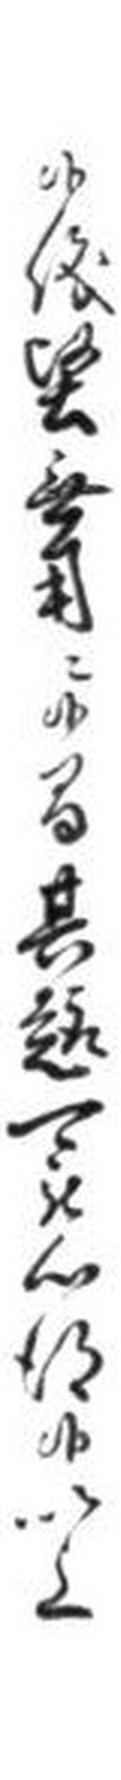候儀堅無用ニ候間其趣可被心得候以上
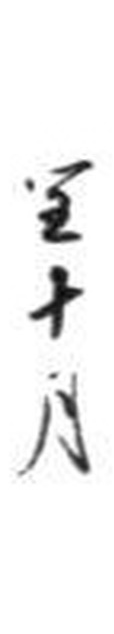閏十月
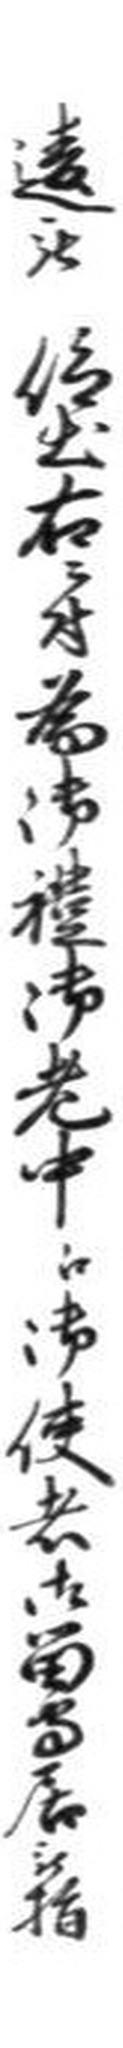違被仰出右ニ付為御礼御老中江御使者御留守居被指
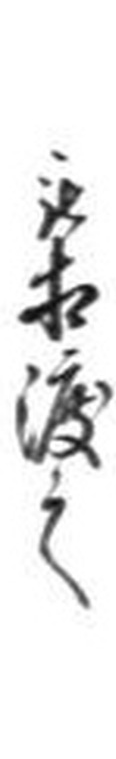被相渡之
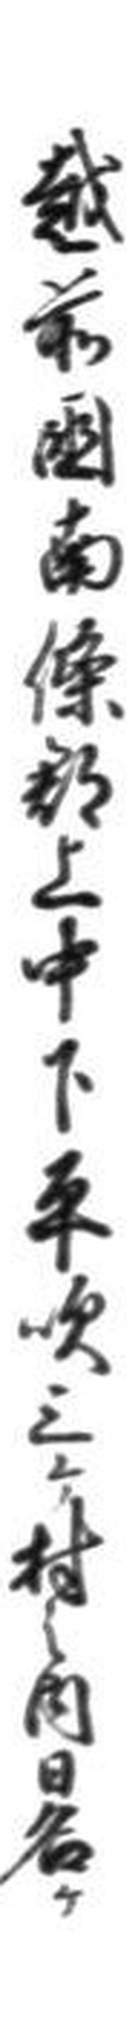越前国南条郡上中下平吹三ケ村之内日名ケ
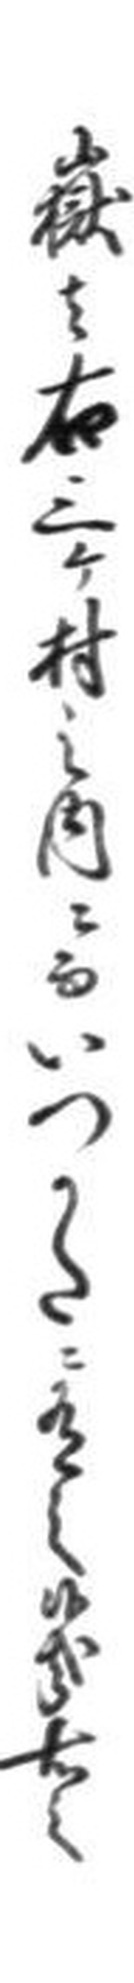嶽者右三ケ村之内ニ而いつかたニ有之候哉右之
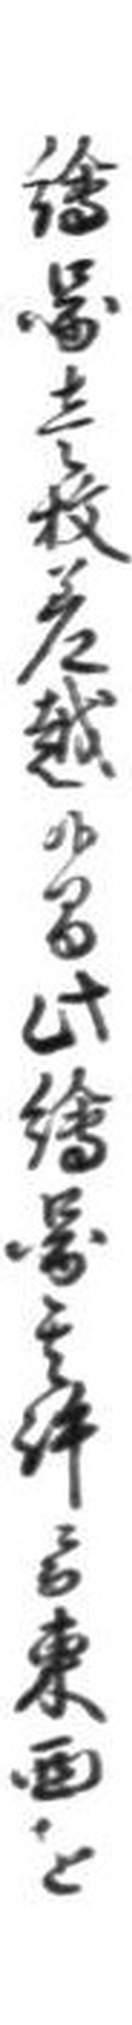絵図壱枚差越候間此絵図其許ニ而東西を
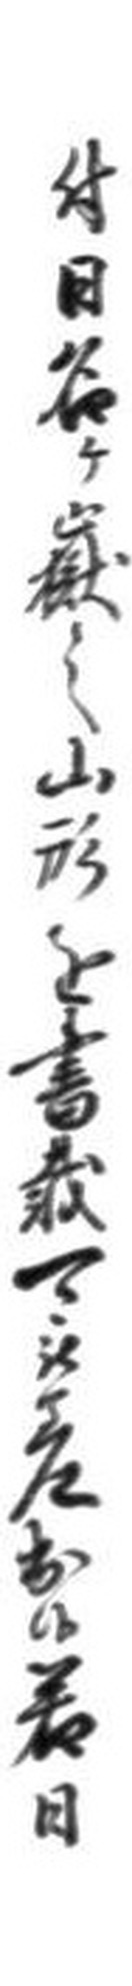付日名ケ嶽之山形を書載可被差出候若日
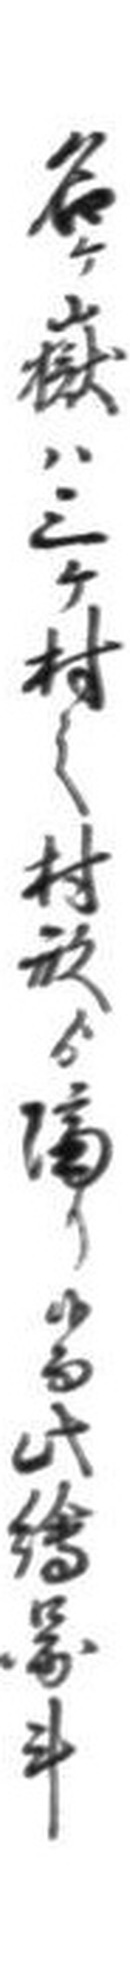名ケ嶽ハ三ケ村之村形ゟ隔り候而此絵図斗
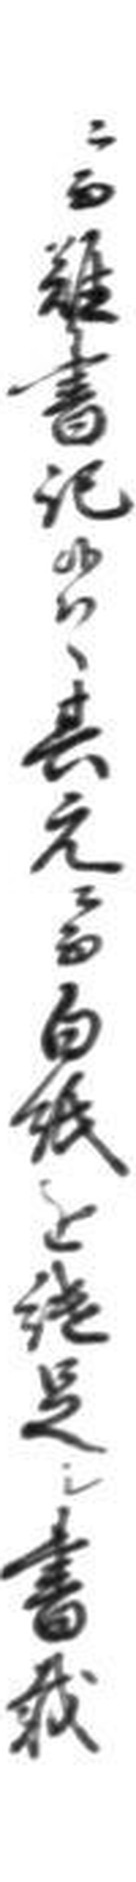ニ而難書記候ハヽ其元ニ而白紙を継足シ書載

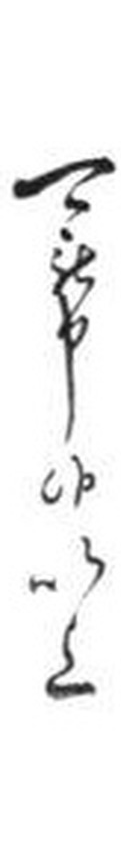可被申候以上
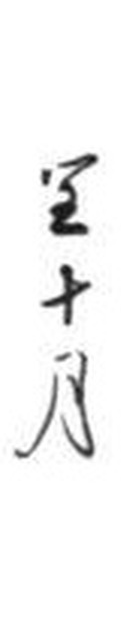閏十月
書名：家譜 三十二 吉邦公 従享保二年到享保三年
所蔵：福井県文書館 Fukui Prefectural Archives
